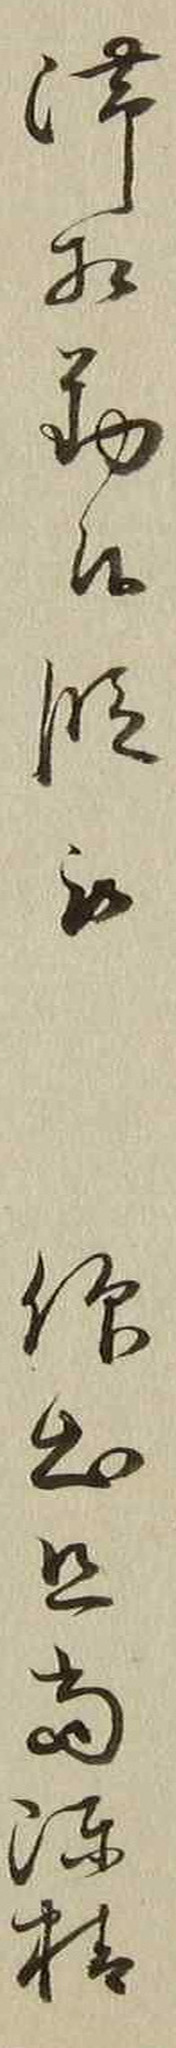滞相勤候段被仰出且当陣精
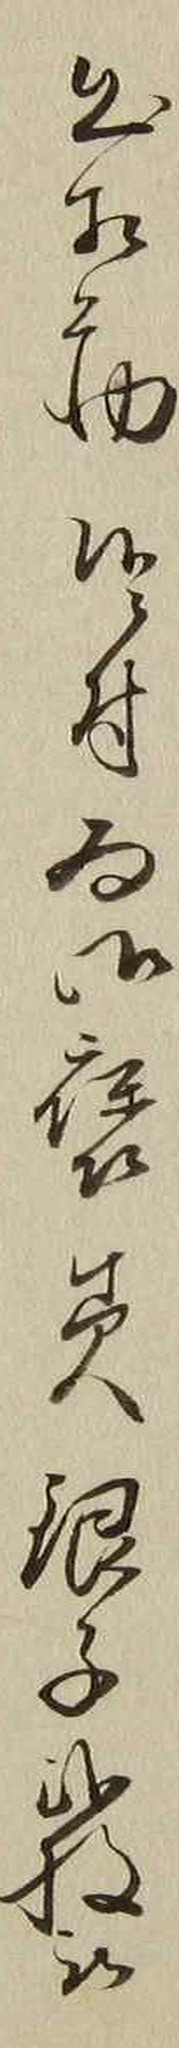出相勤候ニ付為御褒美銀子弐枚被
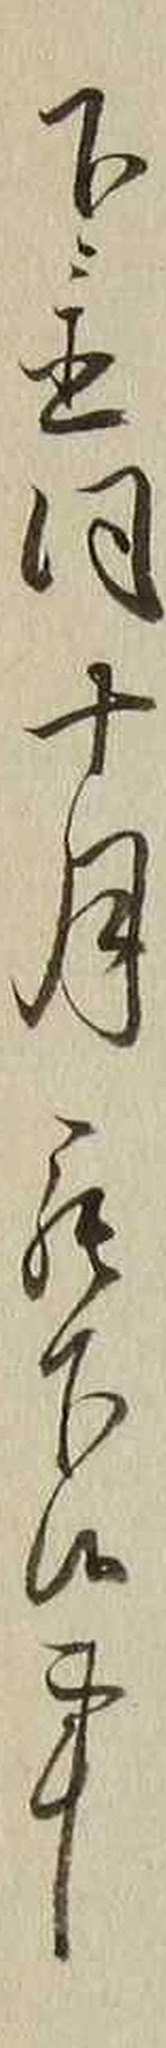下置同十月罷下候事
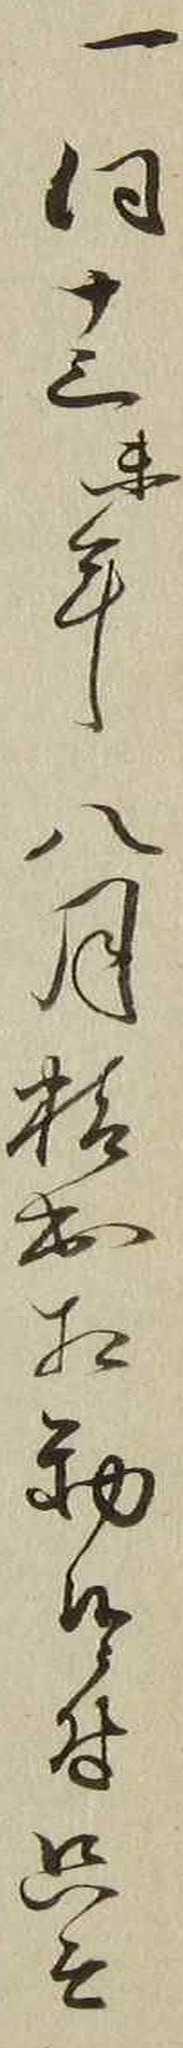一同十三未年八月精出相勤候ニ付只今
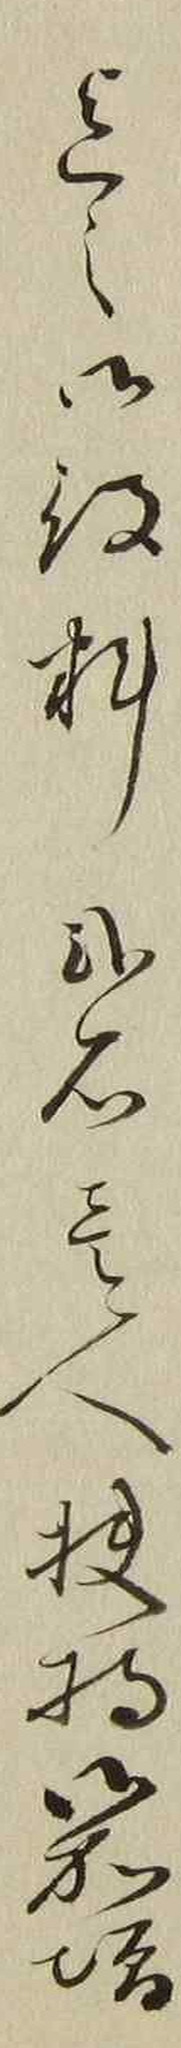迄之御役料弐石壱人扶持御加増
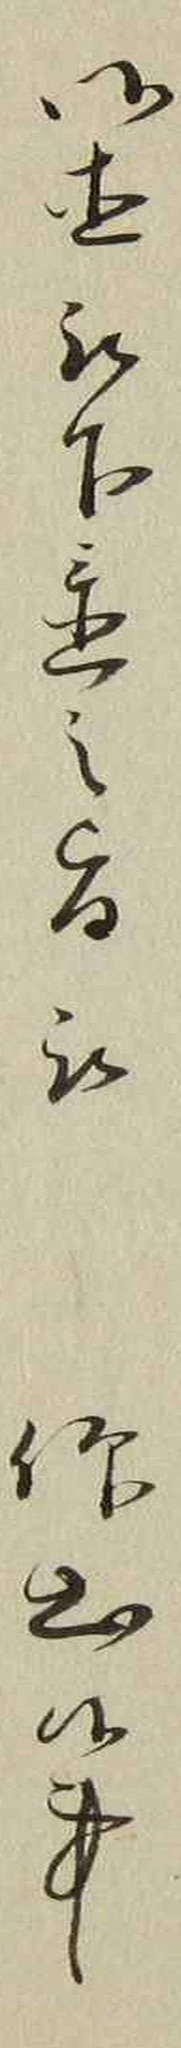御直被下置之旨被仰出候事
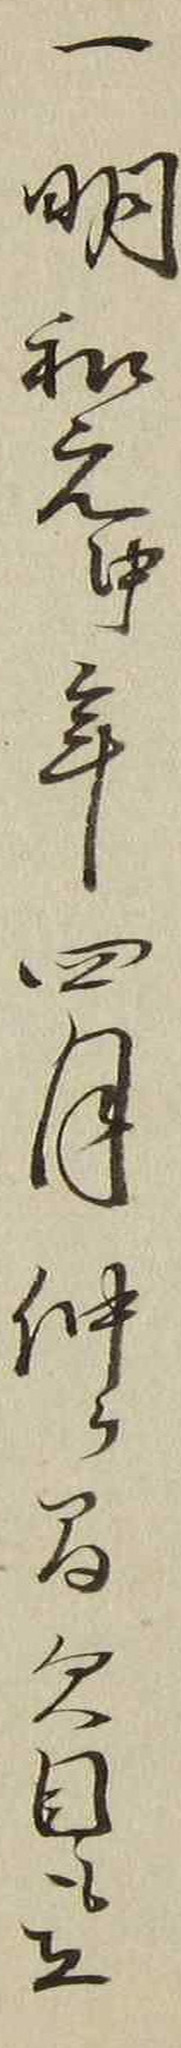一明和元申年四月仲ヶ間欠目も立
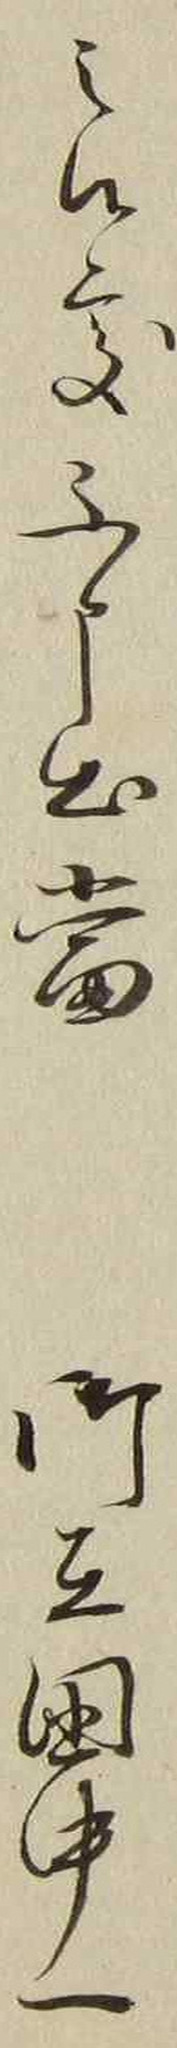之候処不申出御在国中一
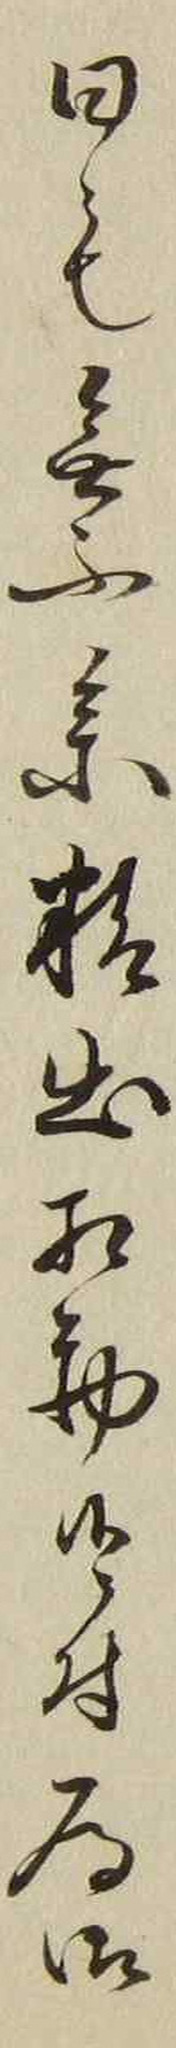日も無不参精出相勤候ニ付為御

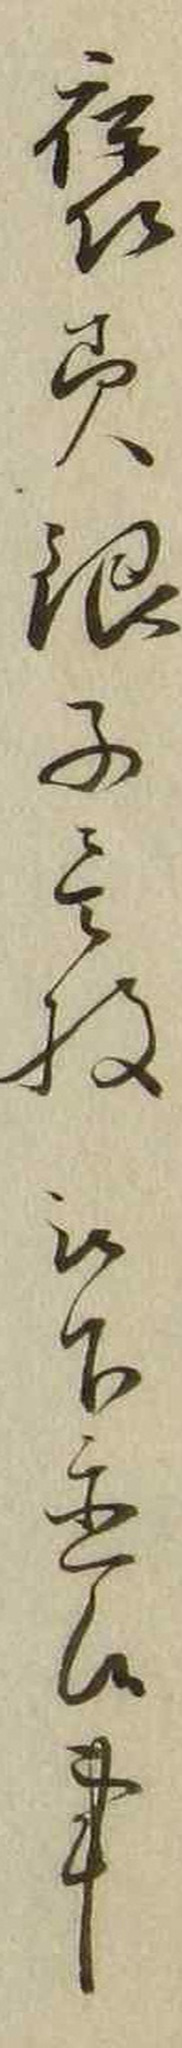褒美銀子壱枚被下置候事
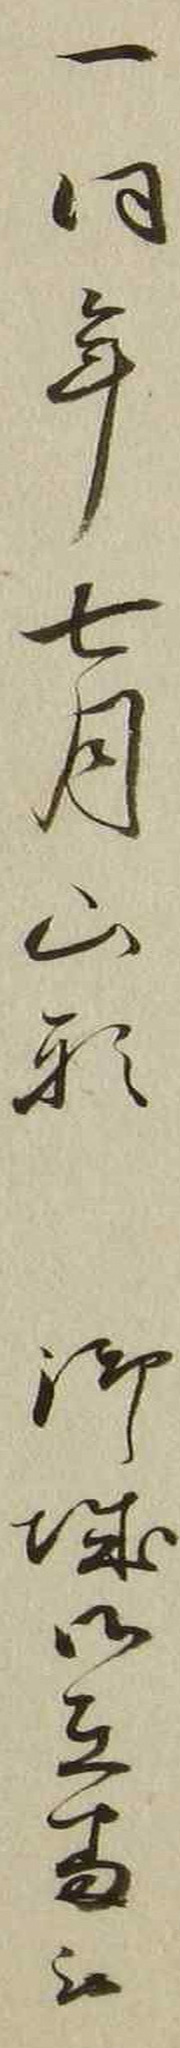一同年七月山形御城御在番被
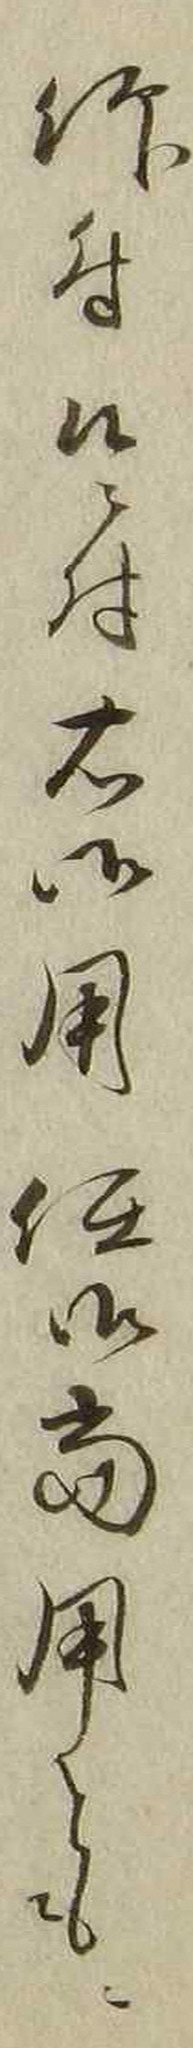仰付候ニ付右御用任御当用ともニ
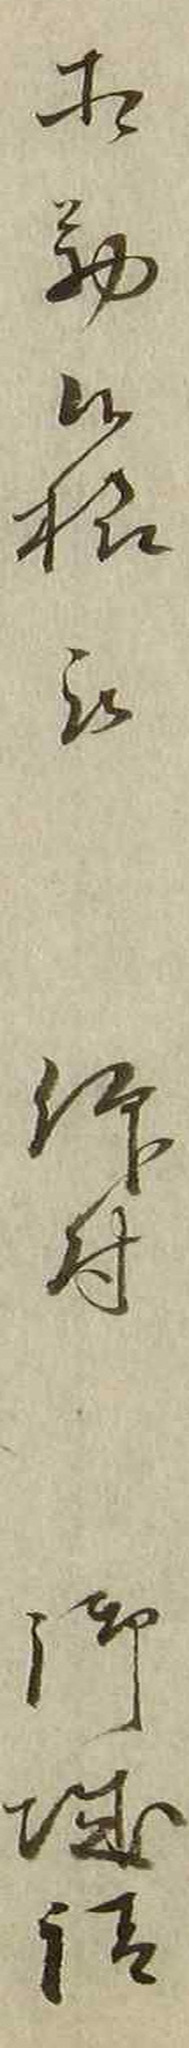相勤候様被仰付御城請
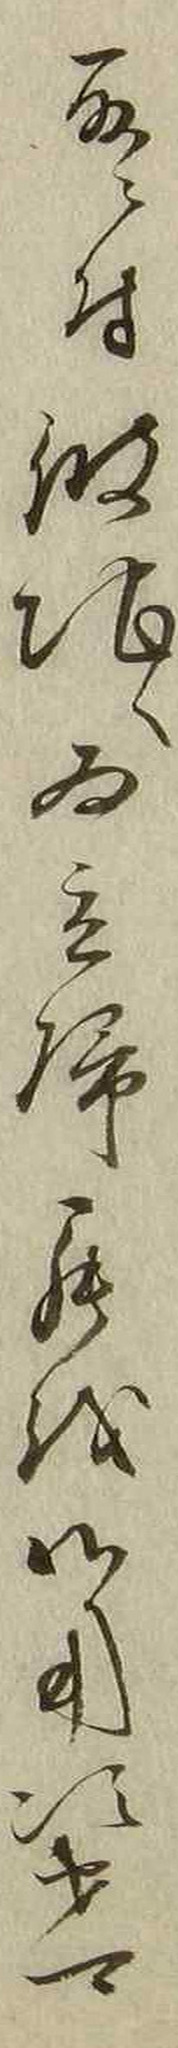取ニ付彼地へ為立帰罷越御用次第可
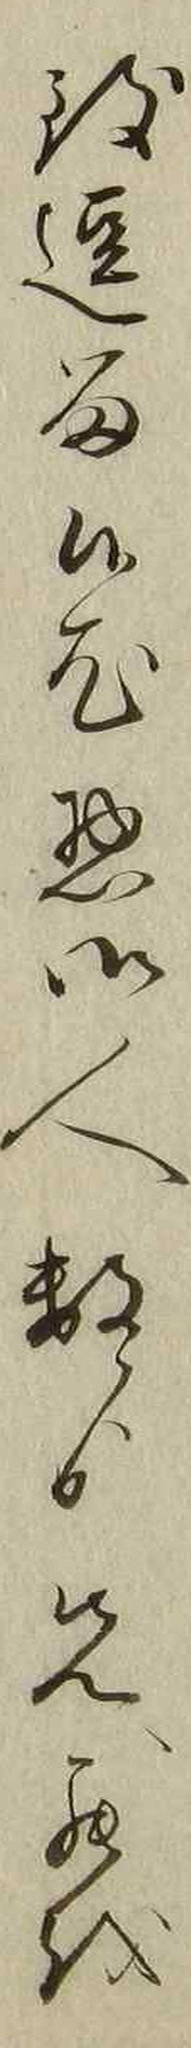致逗留候尤惣御人数ゟ先へ罷越
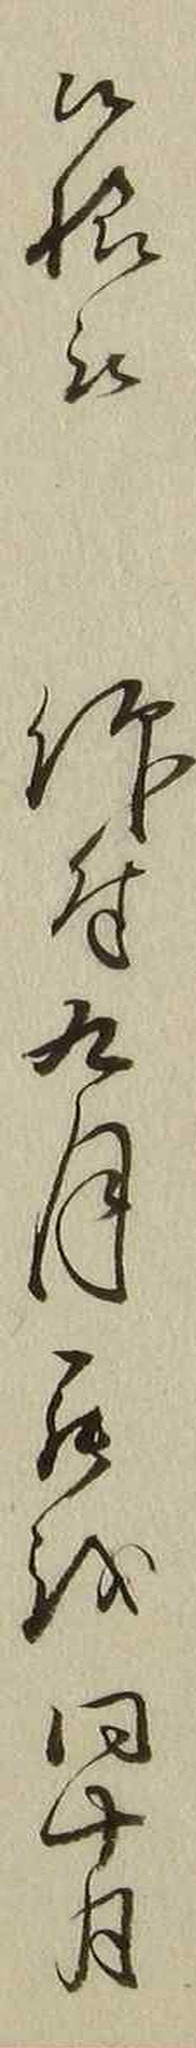候様被仰付九月罷越同十月
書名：諸士系譜　巻之52　に之部3
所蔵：会津若松市立会津図書館
